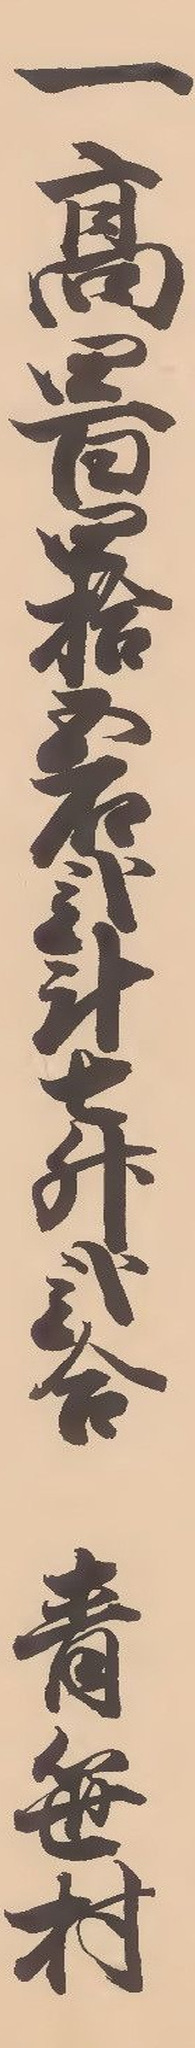一高四百四拾五石弐斗七升弐合青笹村
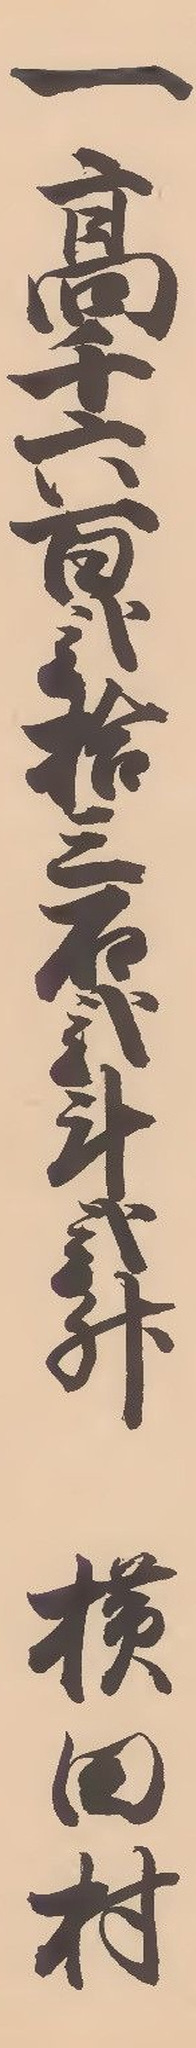一高千六百弐拾三石弐斗弐升横田村

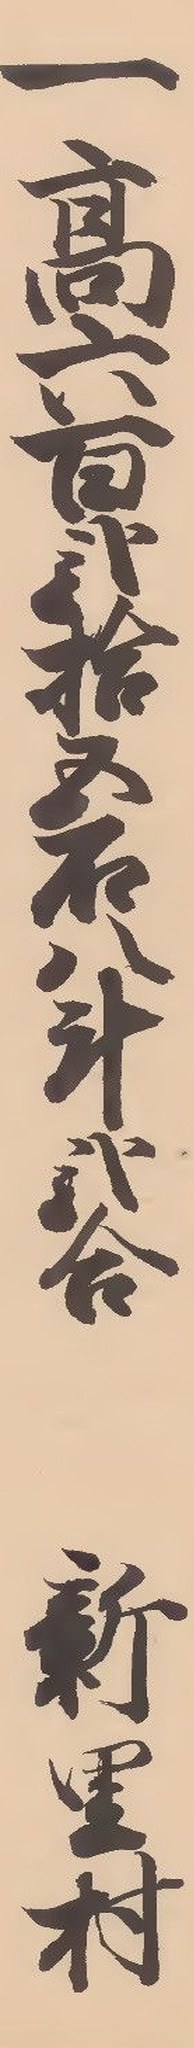一高六百弐拾五石八斗弐合新里村
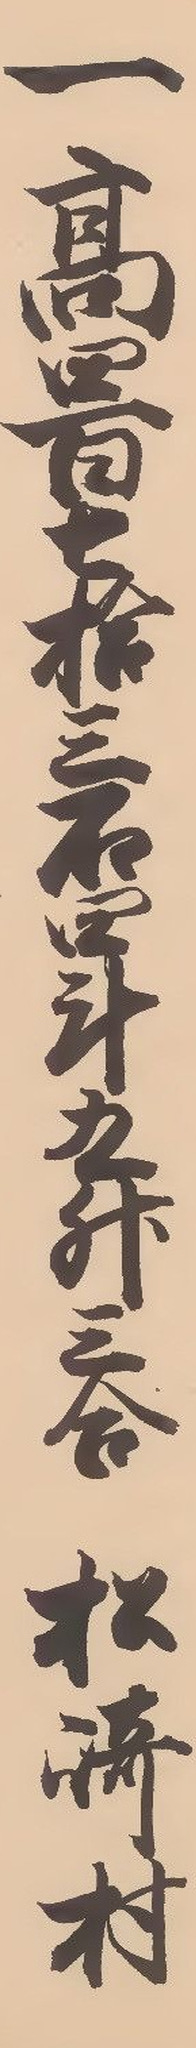一高四百七拾三石四斗九升三合松崎村
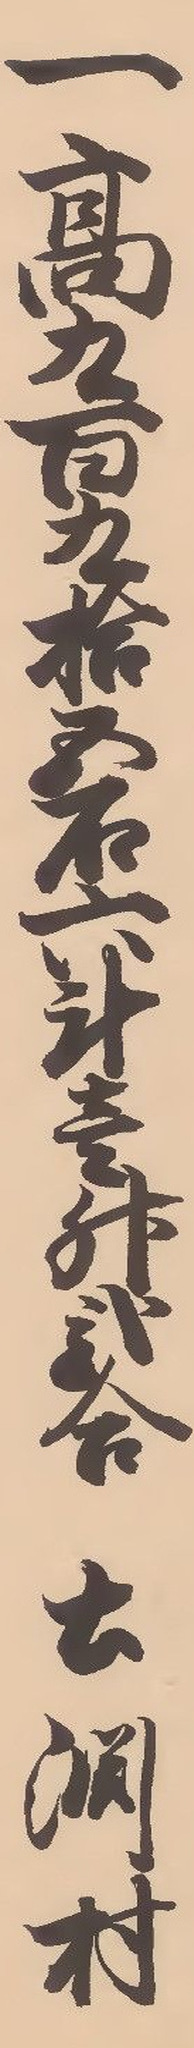一高九百九拾五石六斗壱升弐合土淵村
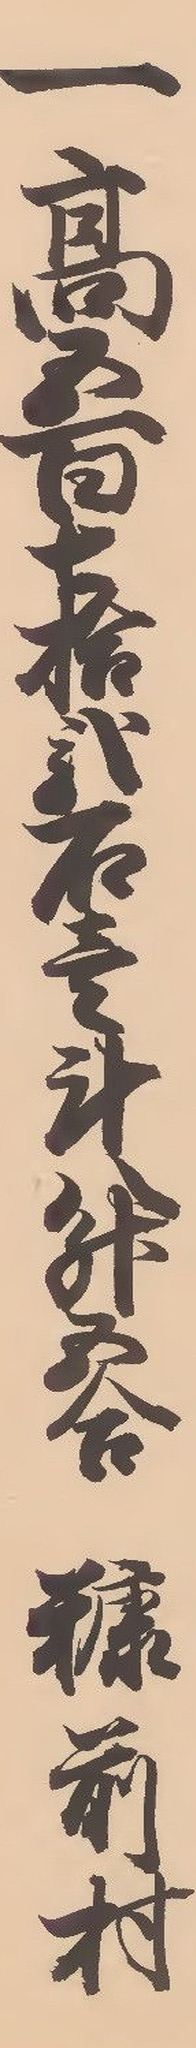一高五百七拾弐石壱斗八升五合糠前村
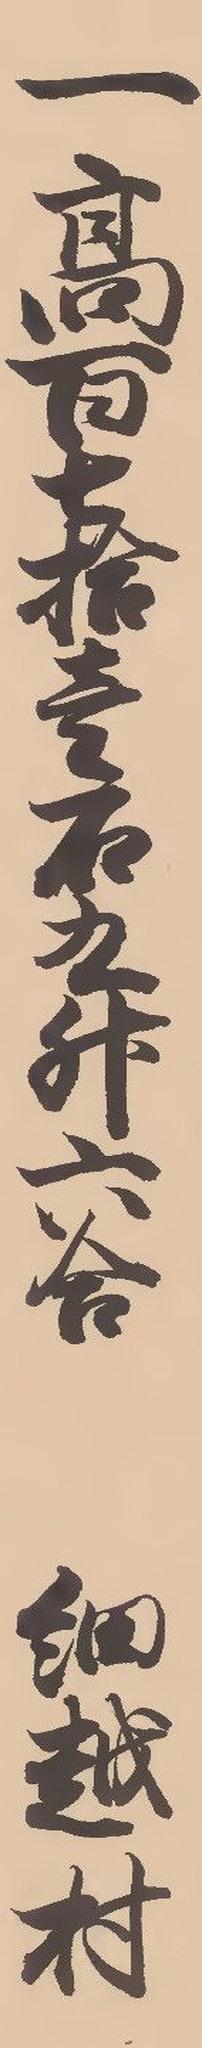一高百七拾壱石九升六合細越村
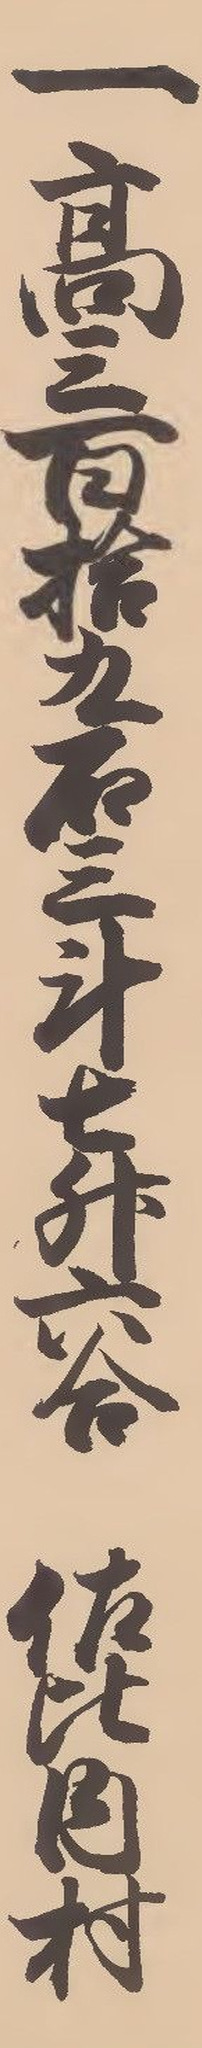一高三百拾九石三斗七升六合佐比内村
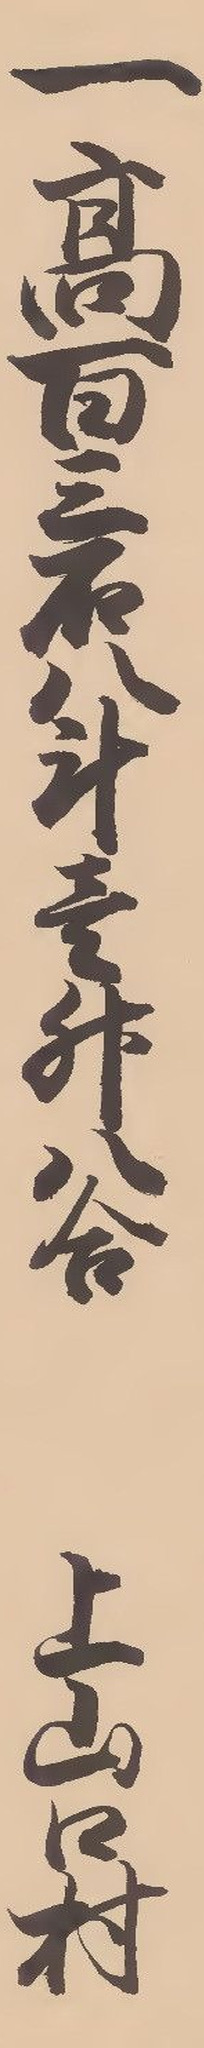一高百三石八斗壱升八合上山口村
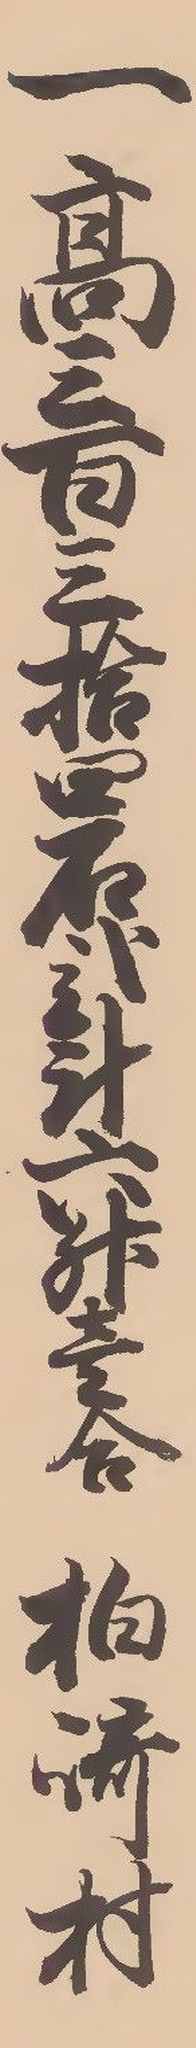一高三百三拾四石弐斗六升壱合柏崎村

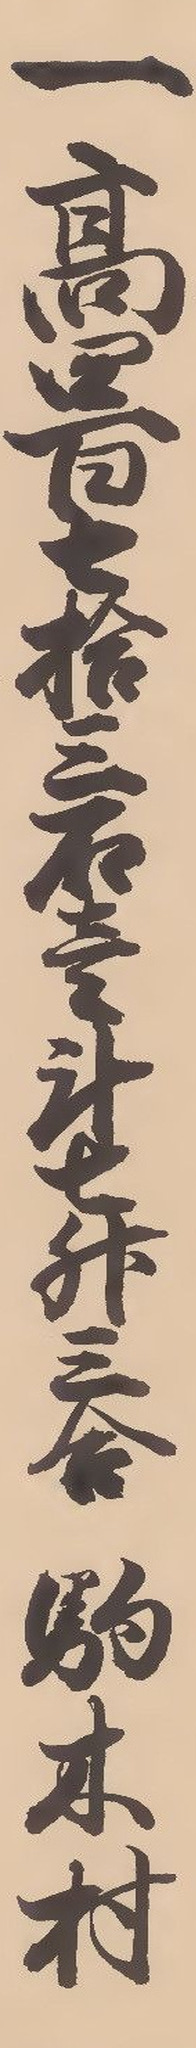一高四百七拾三石壱斗七升三合駒木村
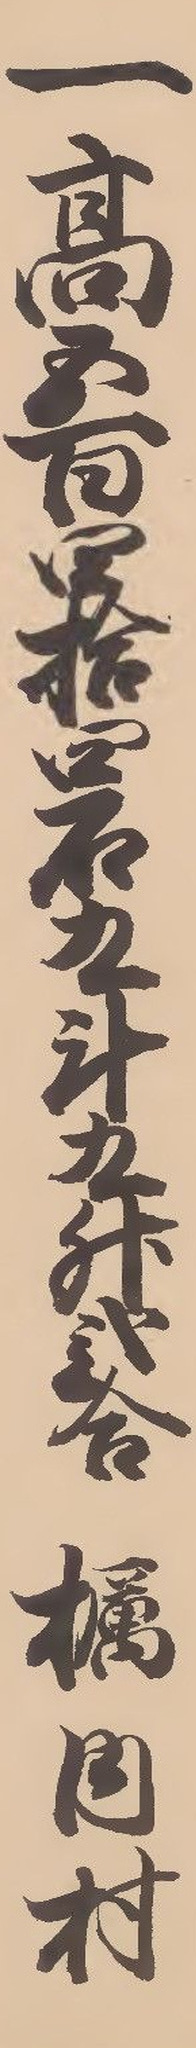一高五百四拾四石九斗九升弐合栃内村
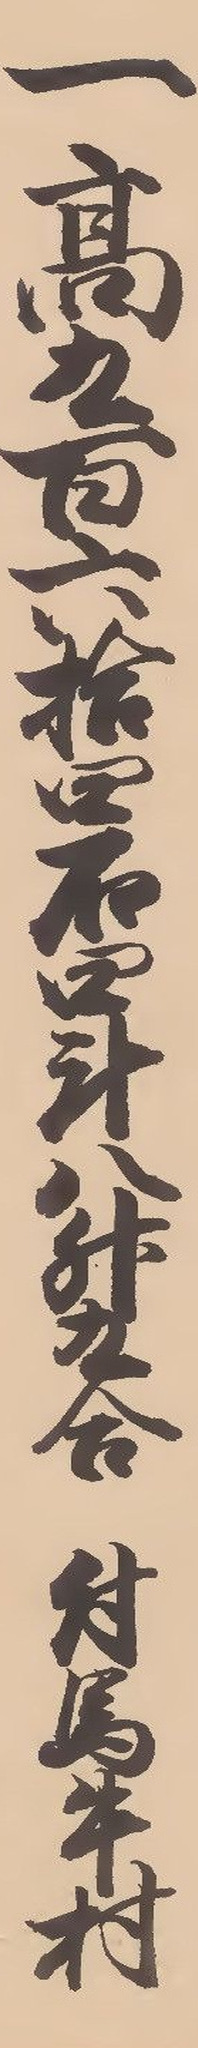一高九百六拾四石四斗八升九合付馬牛村
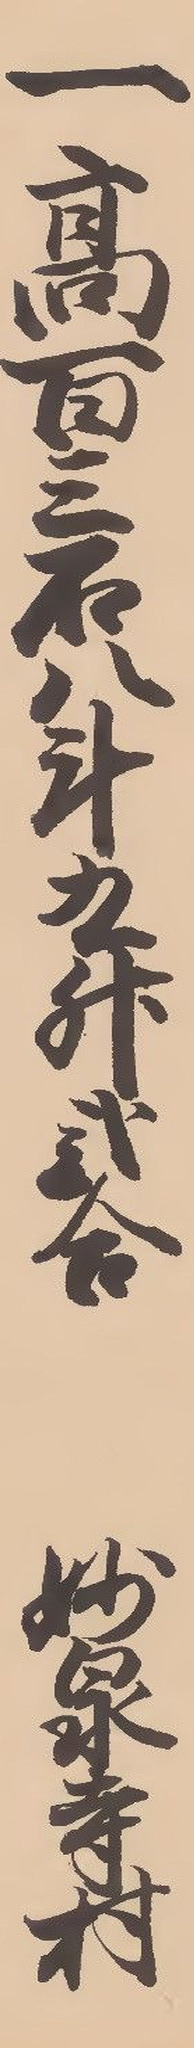一高百三石八斗九升弐合妙泉寺村
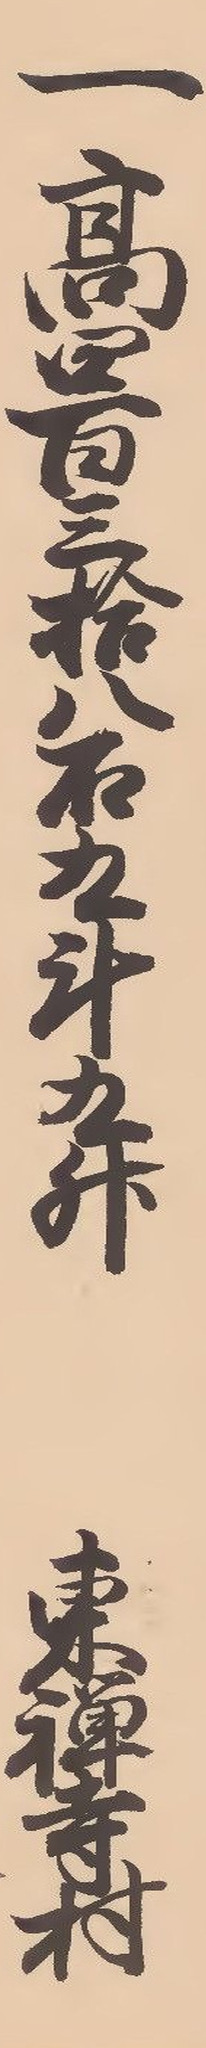一高四百三拾八石九斗九升東禅寺村
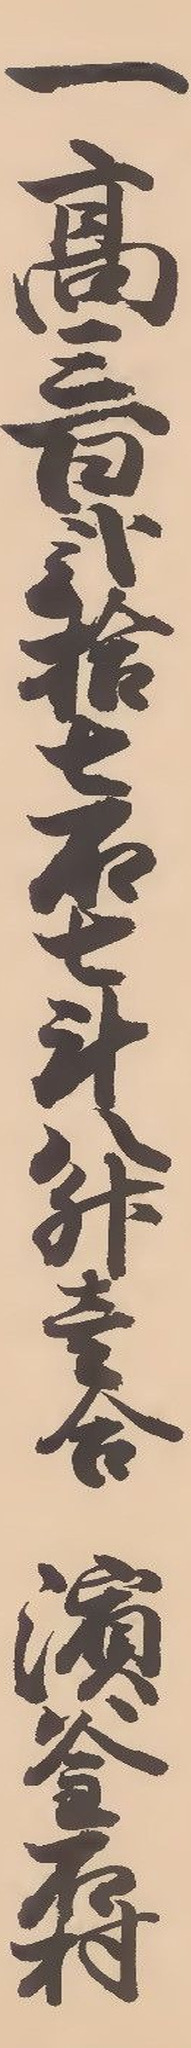一高三百弐拾七石七斗八升壱合浜釜石村
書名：陸奥国郷帳　６
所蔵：国立公文書館 National Archives of Japan
